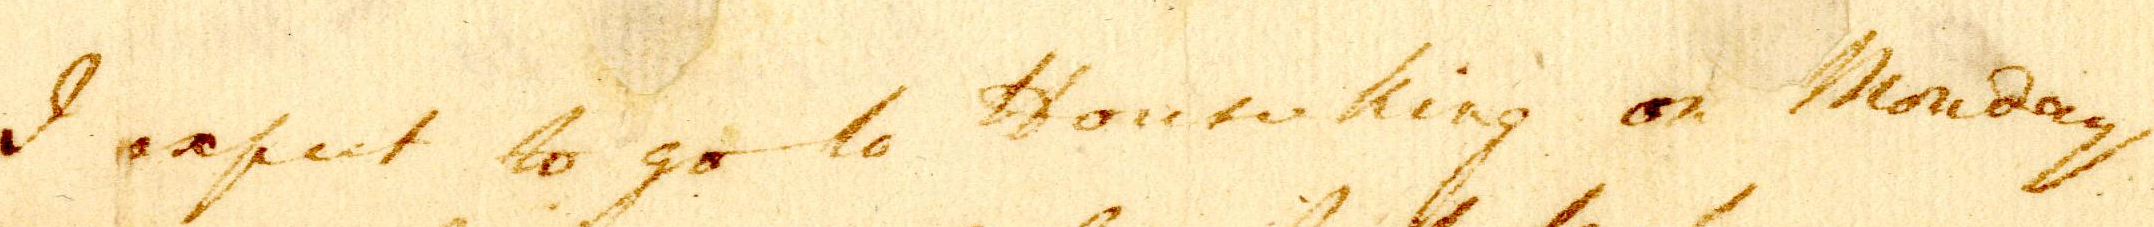I expect to go to Houseking on Monday
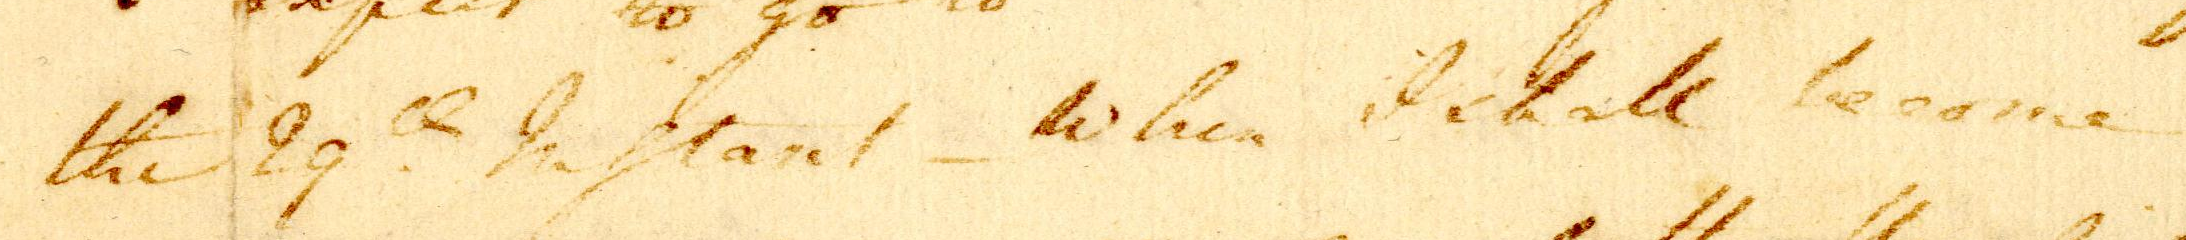the 29^th. Instant. When I shall become
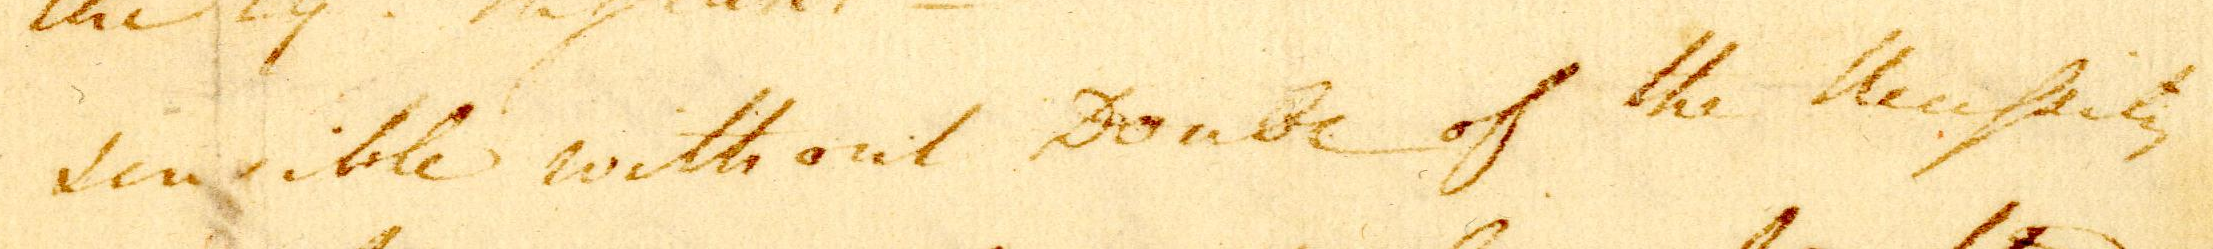sensible without Doubt of the Necessity
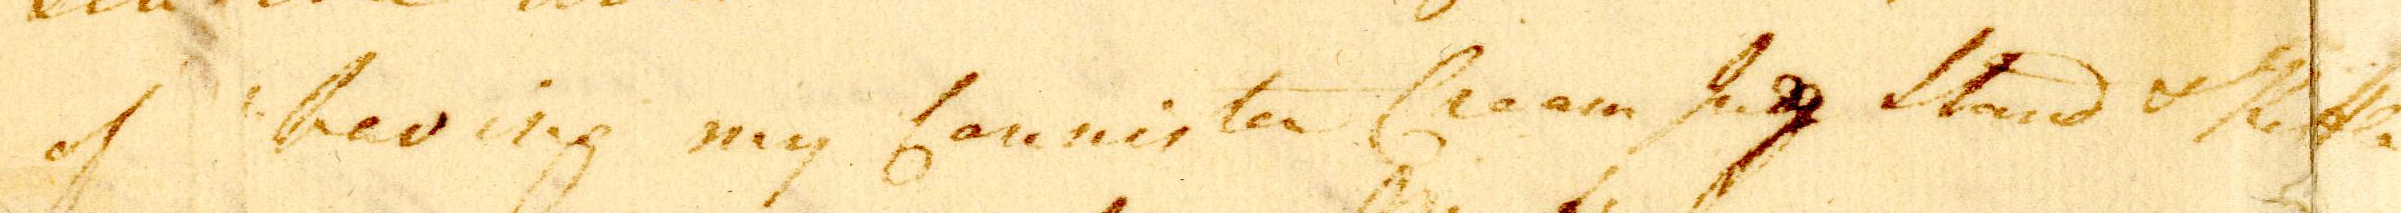of having my Cannister Cream Jug Stand & Kettle
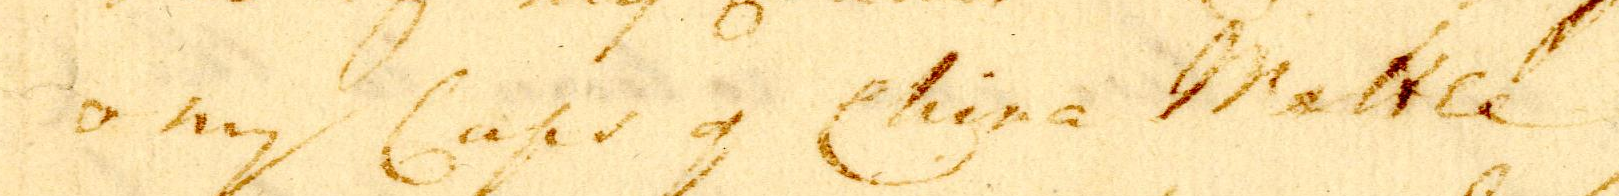my Cups of China Mattle
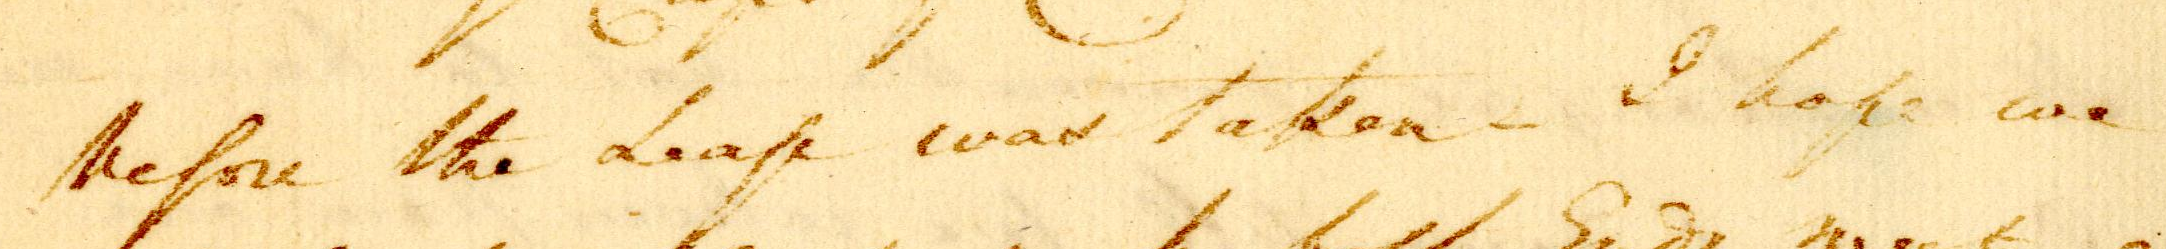before the Leap was taken. I hope we
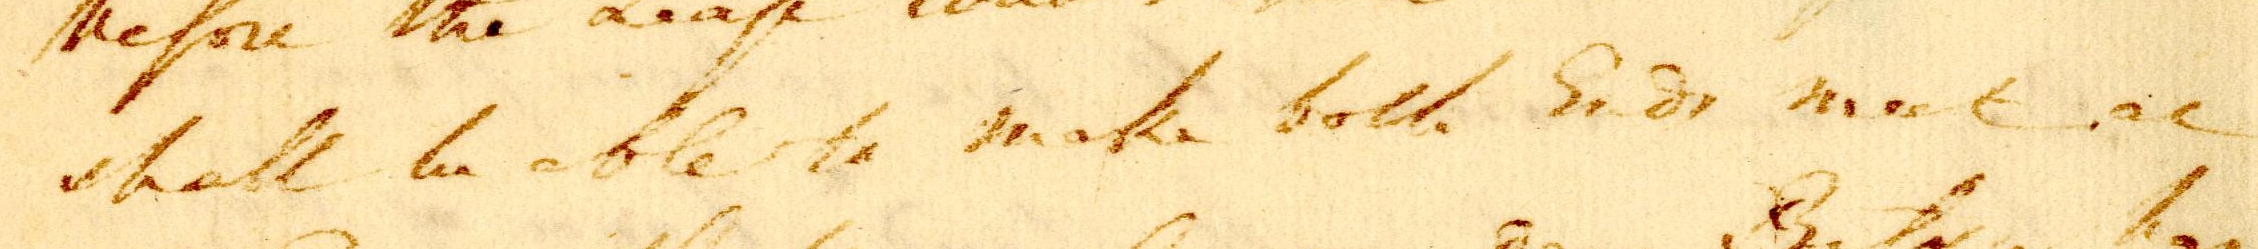shall be able to make both Ends meet at
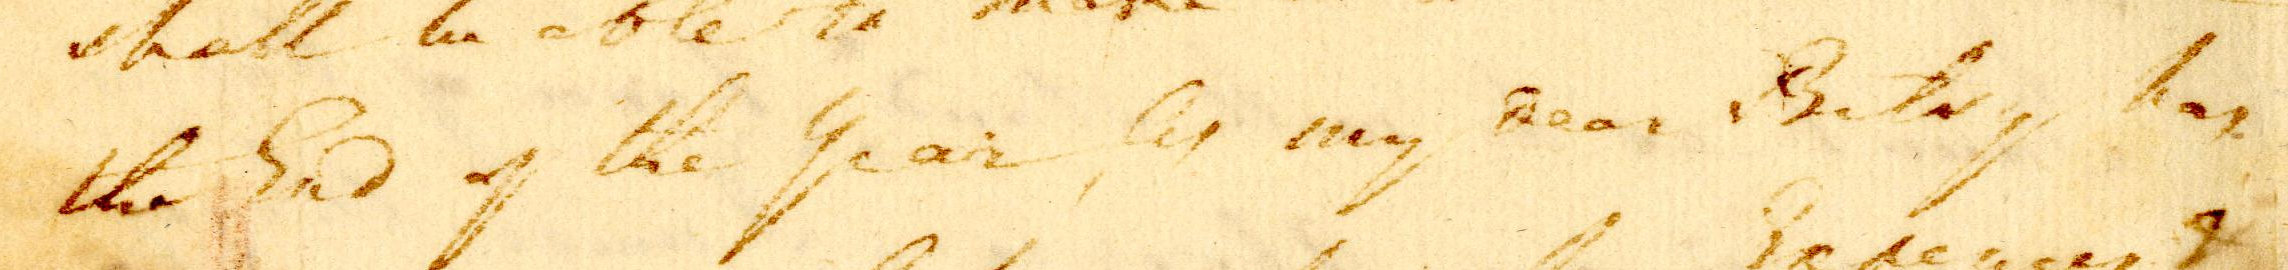the End of the Year, let my dear Betty has
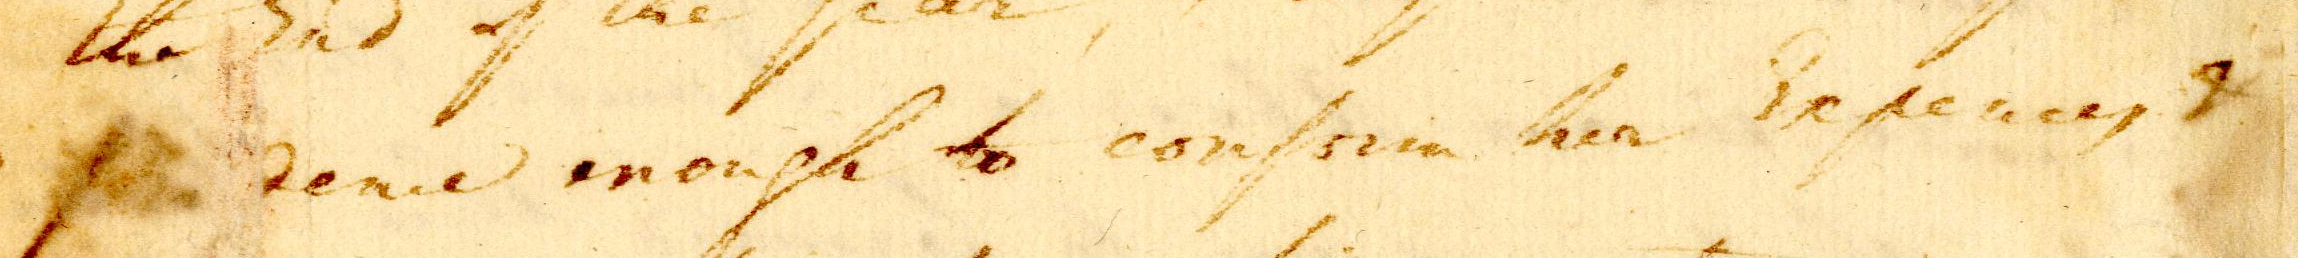prudence enough to conform her Expences &
